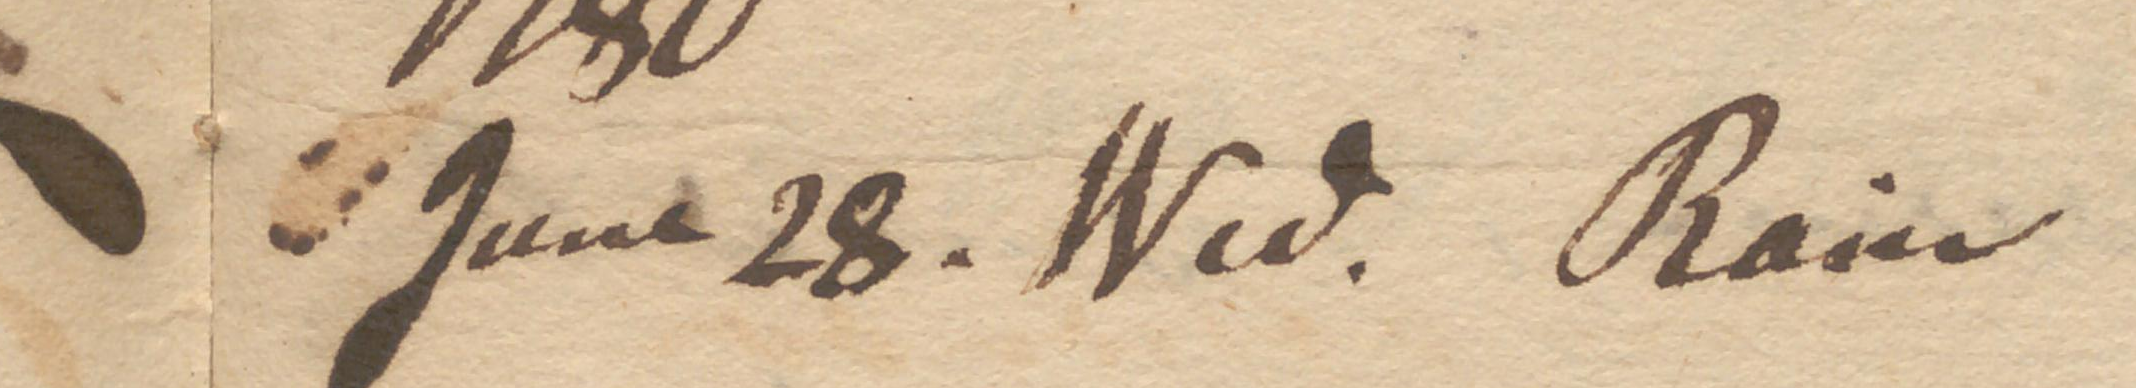June 28h. Wed. Rain
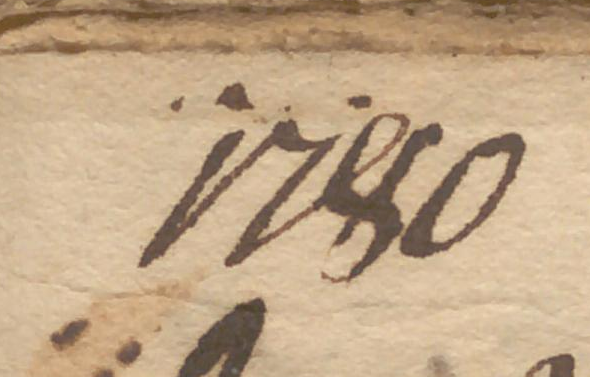1780
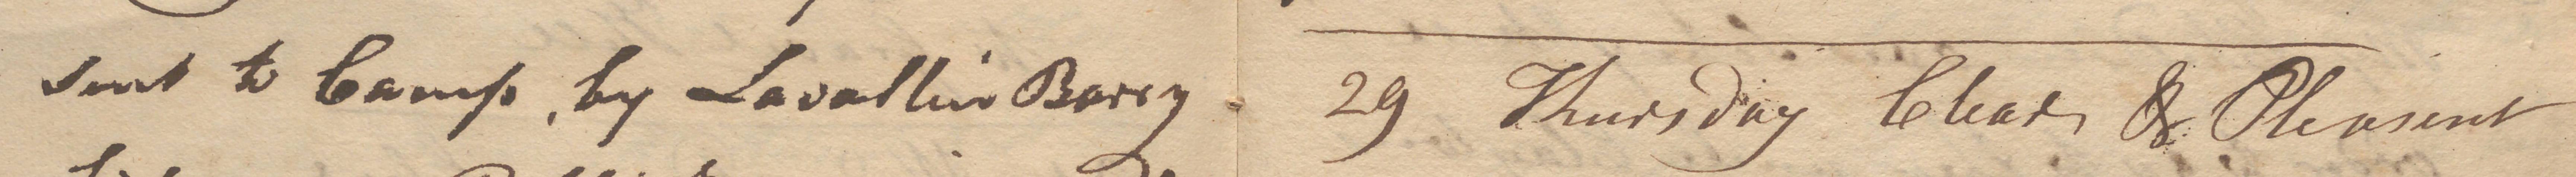Sent to Camp, by Lavallin Barry 29 Thursday Clear &. Plensent
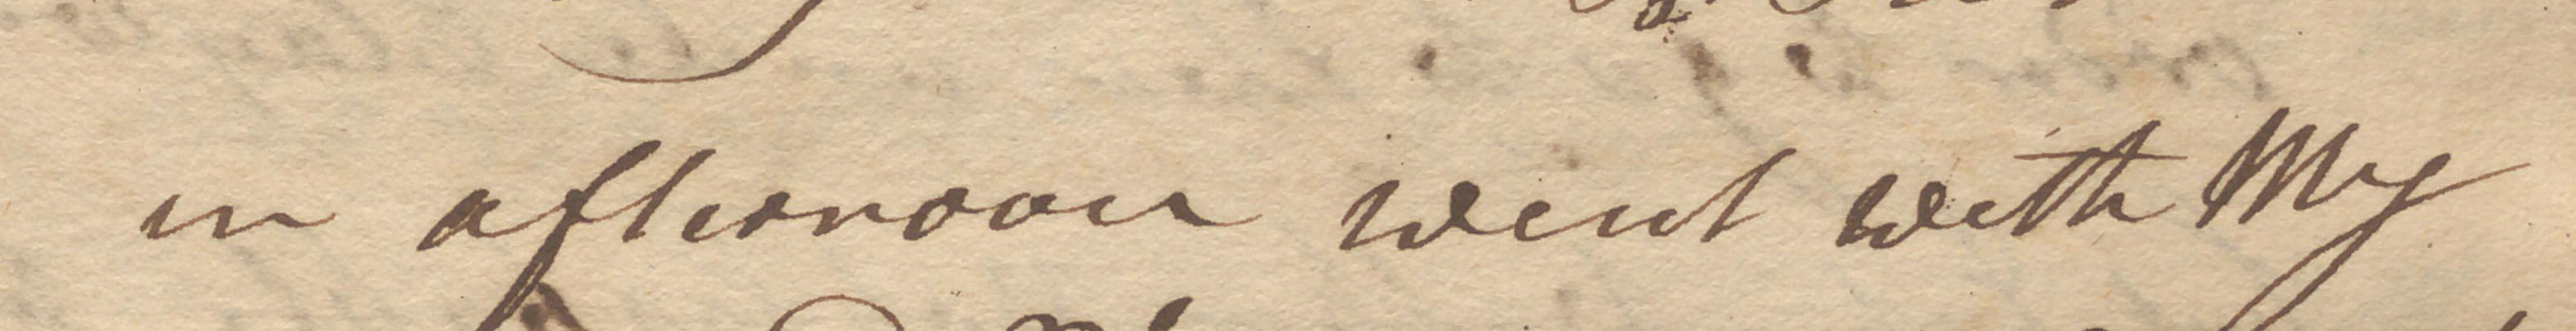in afternoon went with My
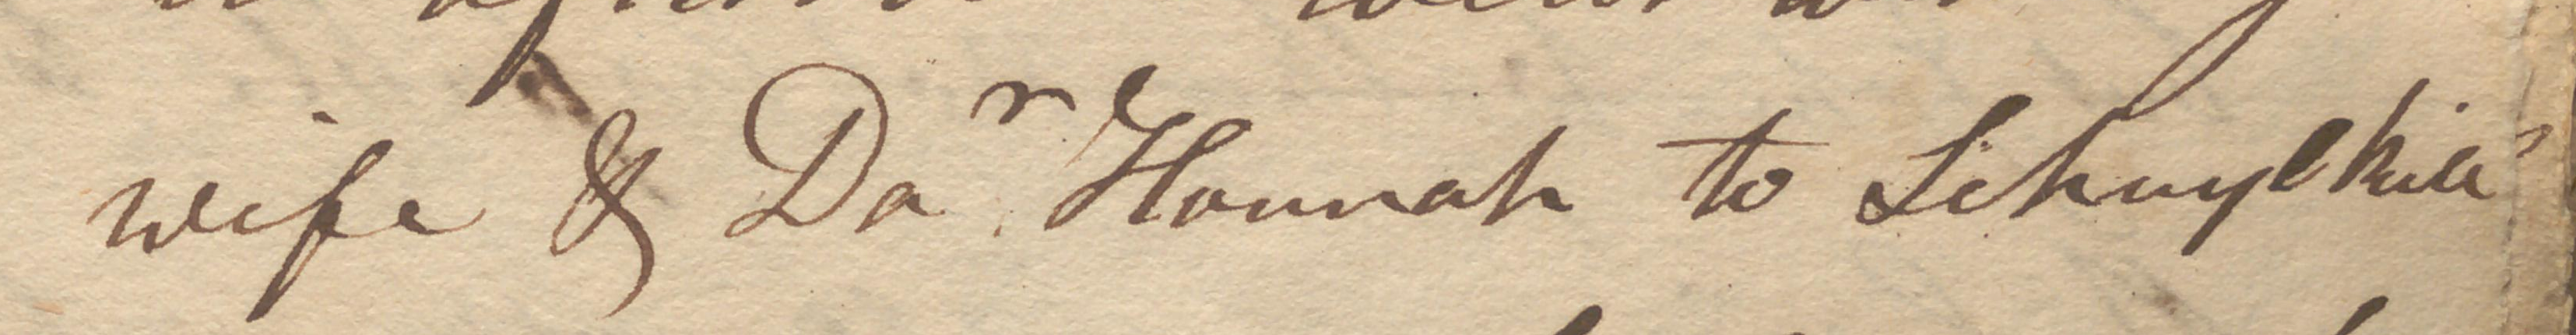wife & Da^r. Hannah to Schuylkill
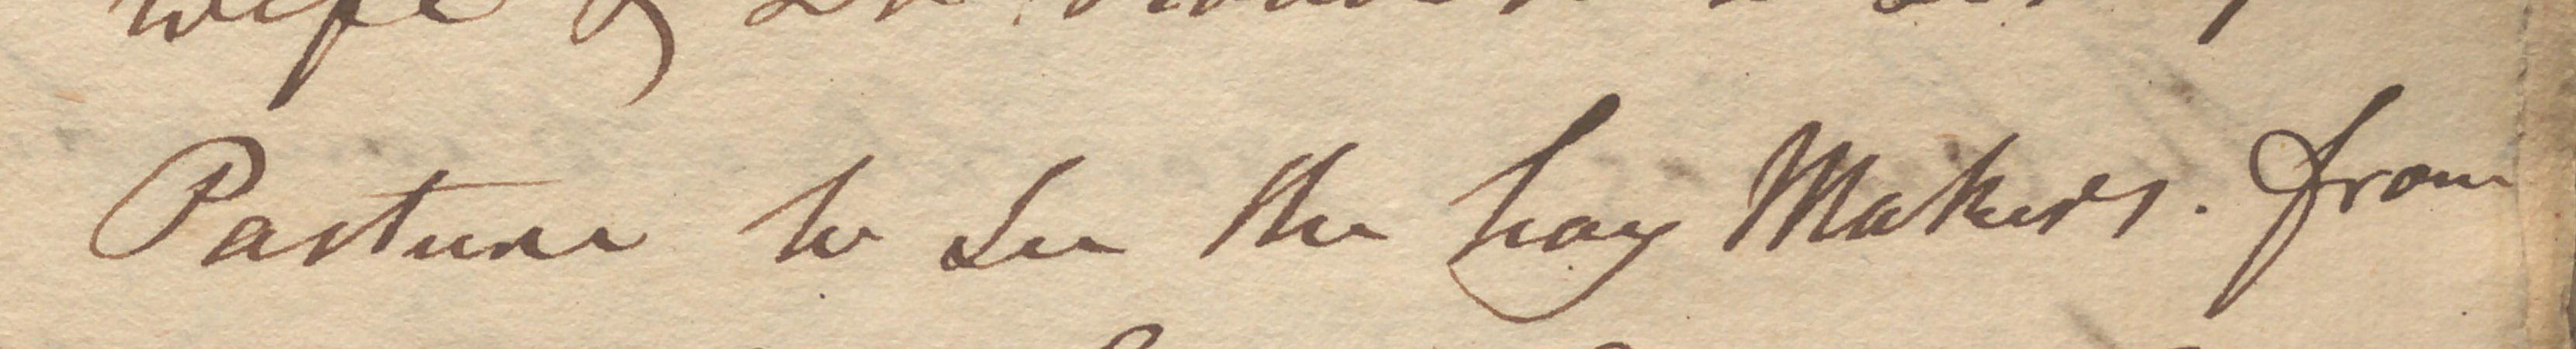Pasture to see the hay Makers. from
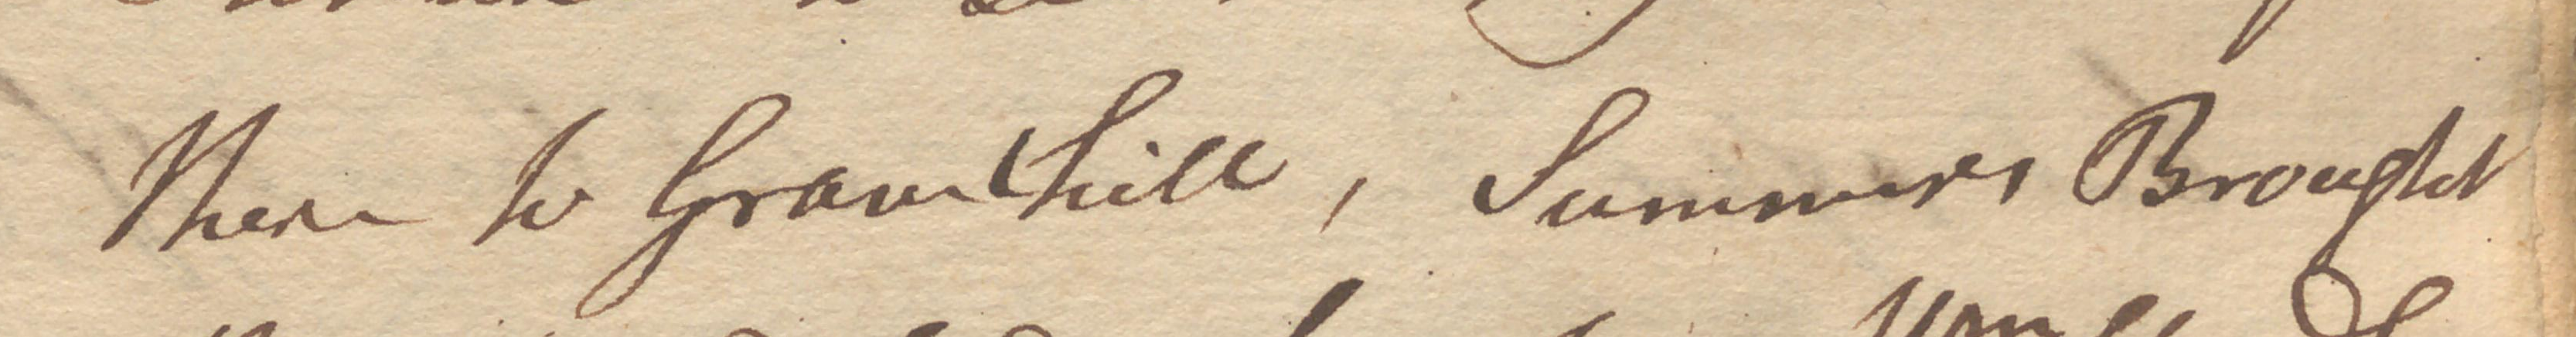there to Gravelhill, Summers Brought
